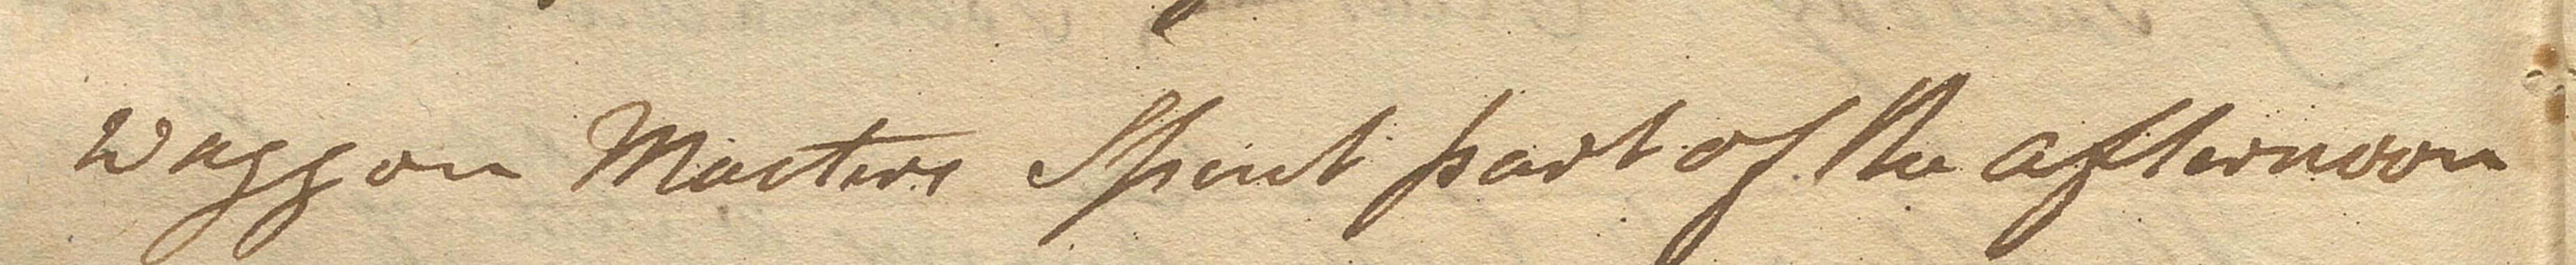waggon Masters Spent part of the afternoon
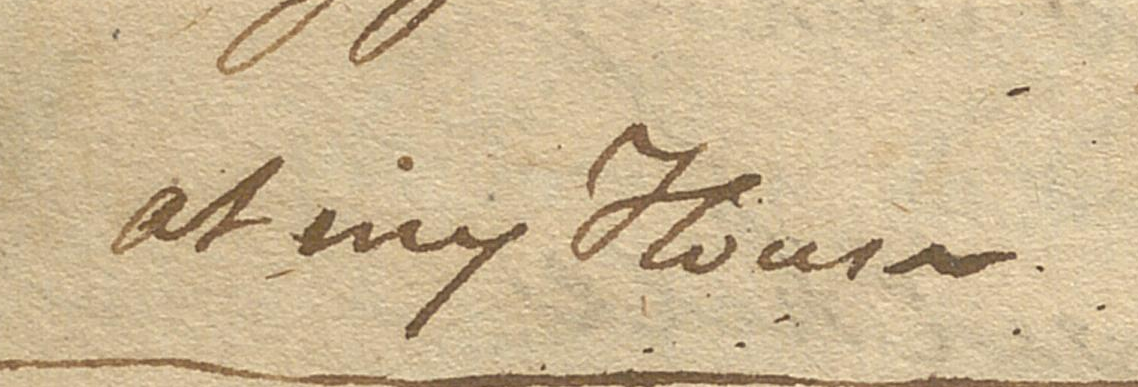at my House
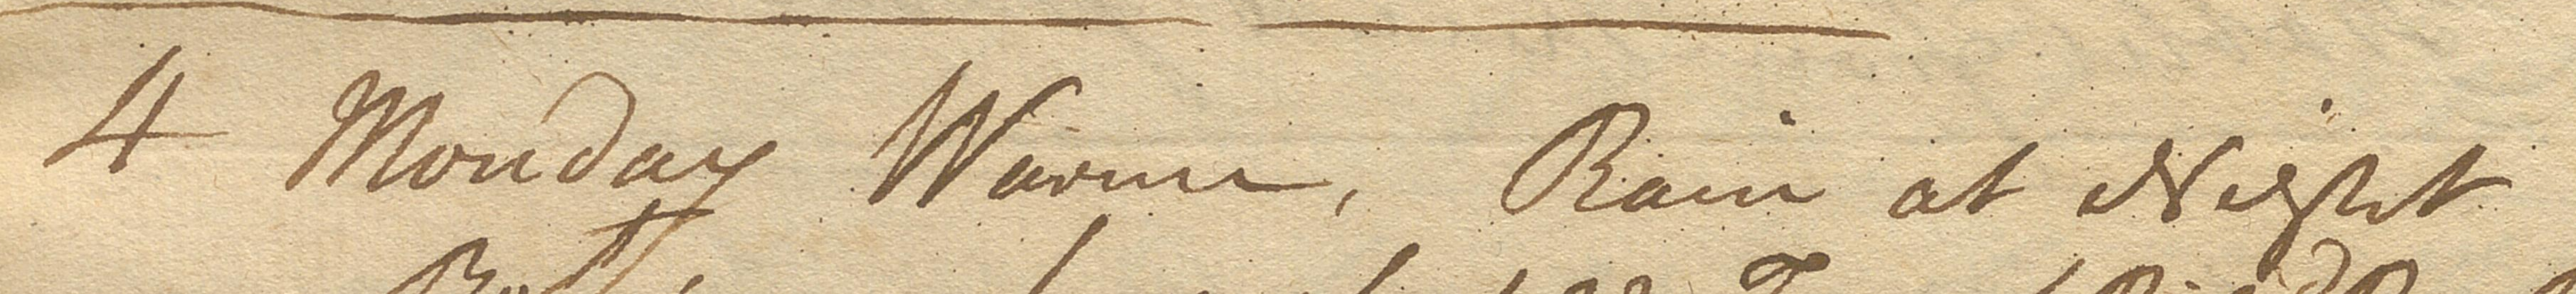4 Monday Warne, Rain at Night
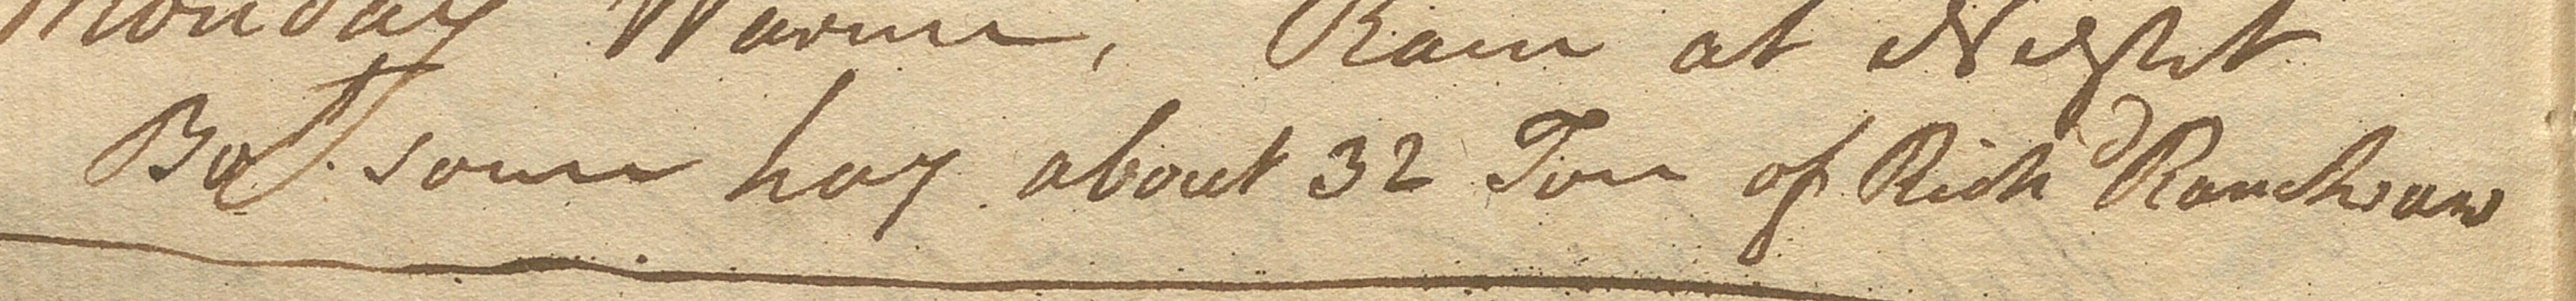Bo^t. some hay about 32 Ton of Rich^d Renshaw
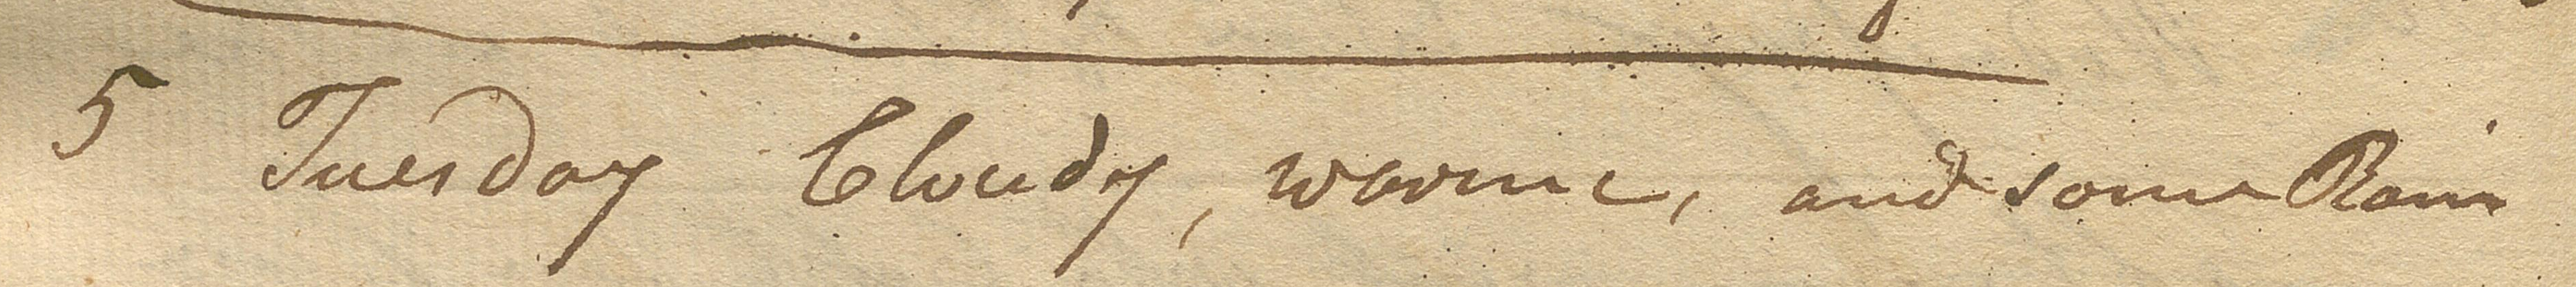5 Tuesday Cloudy warme, and some Rain
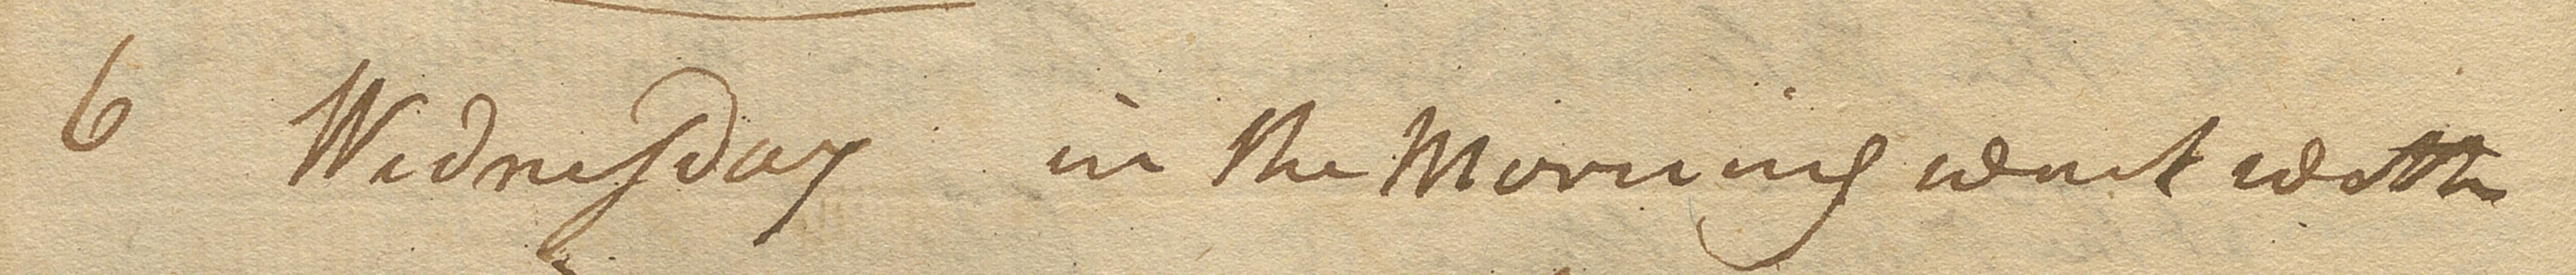6 Wednesday in the Morning wet with
